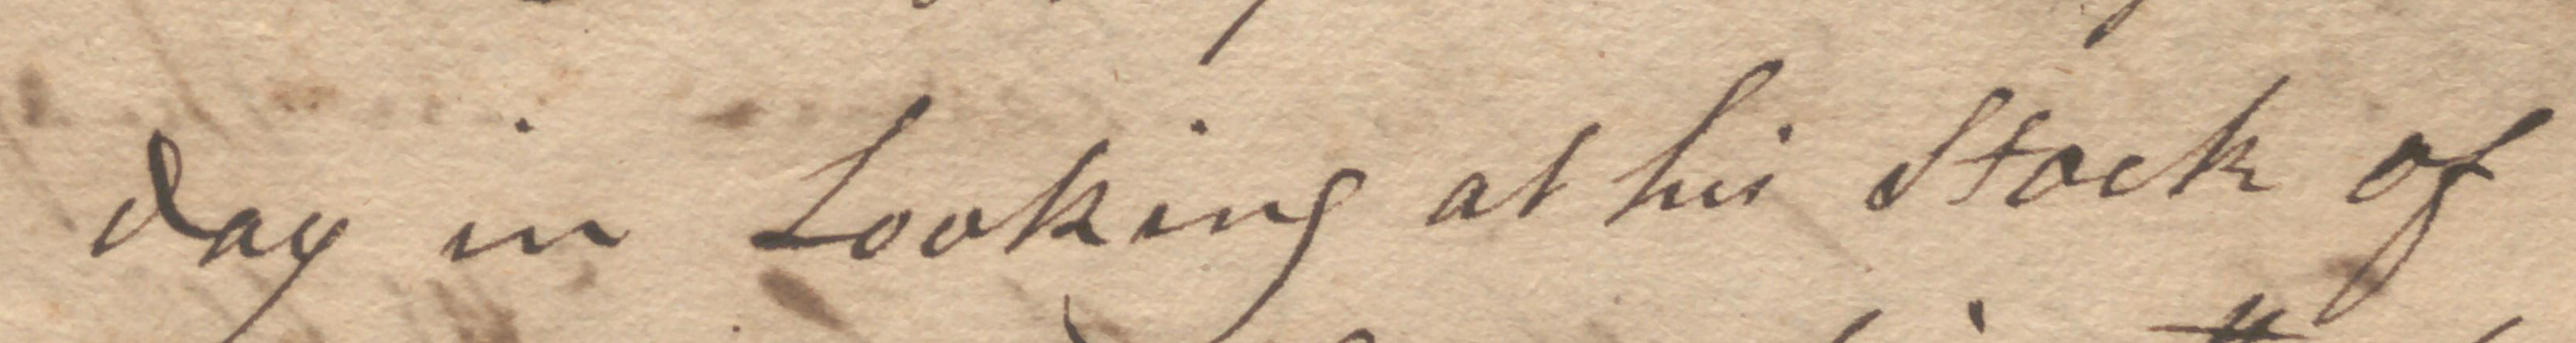day in Looking at his Stack of
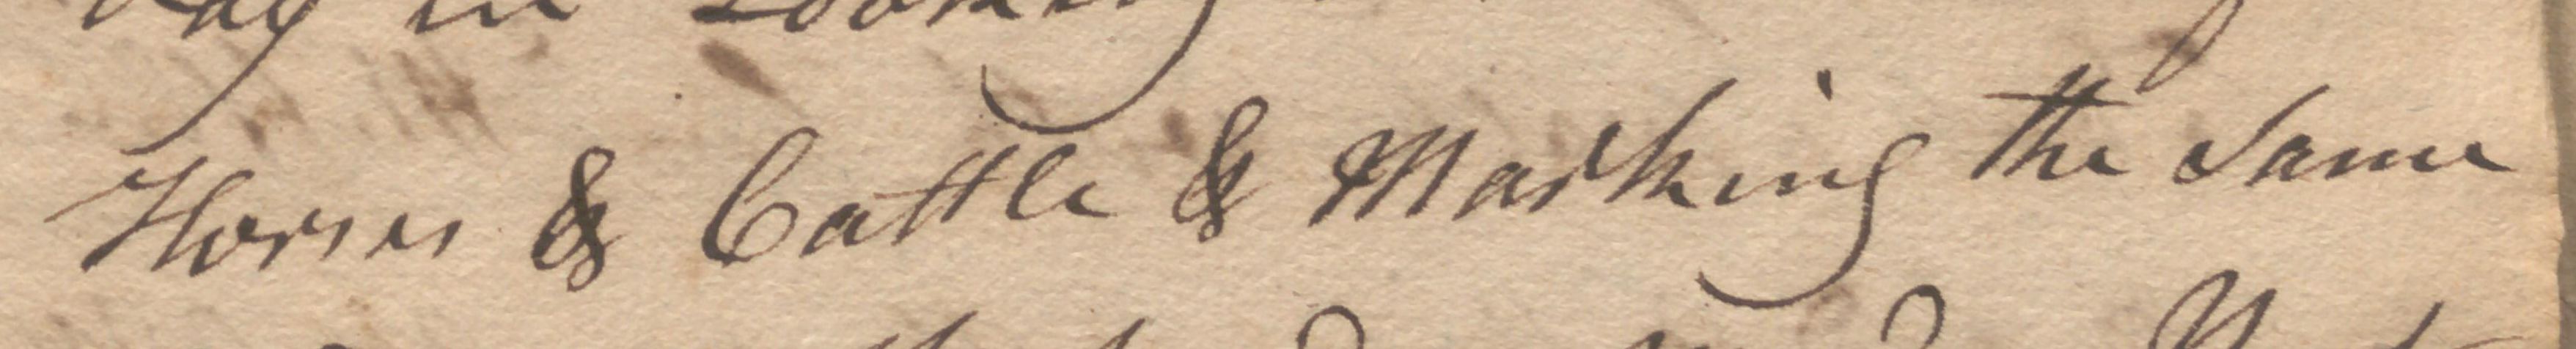Horses & Cattle & Marking the same
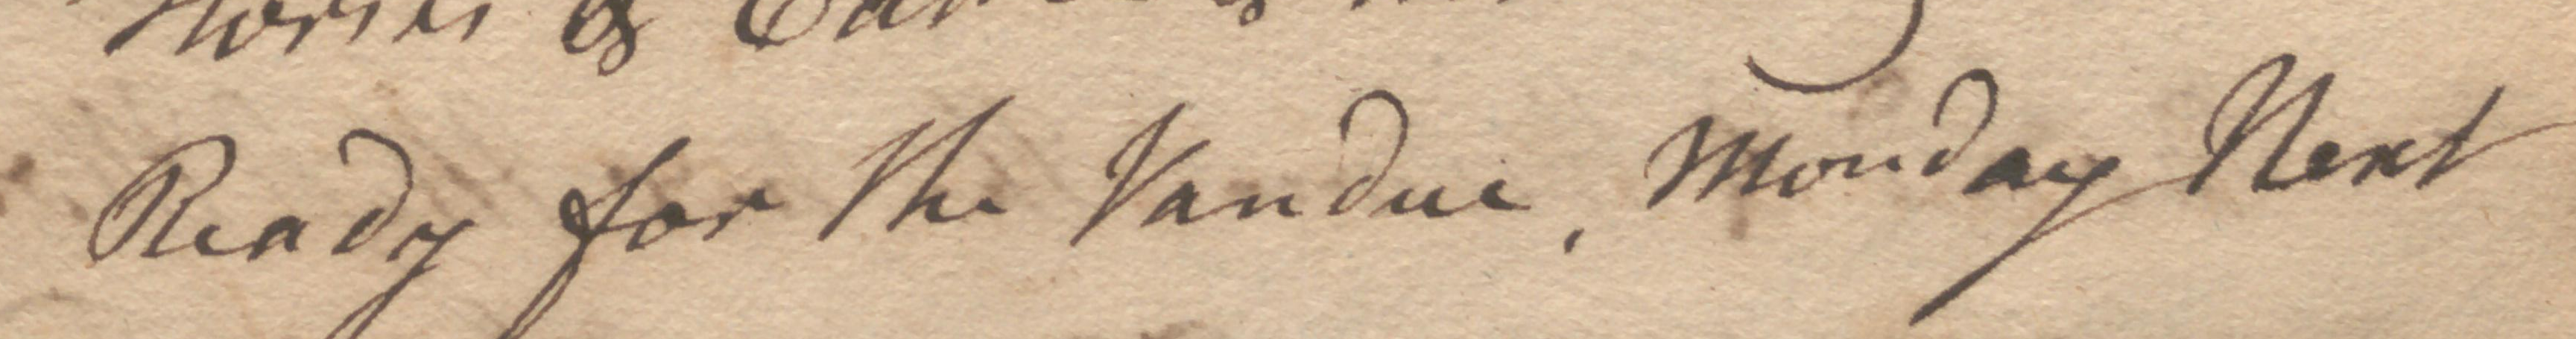Ready for the Vandue Monday Next
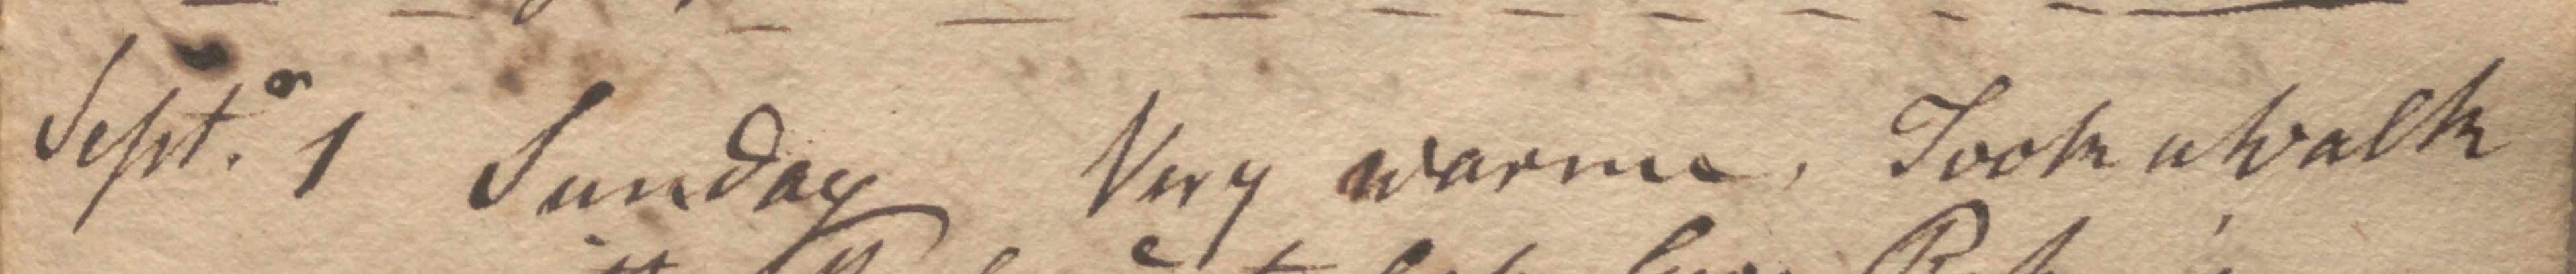Sept^r. 1 Sunday Very warme, Took a walk
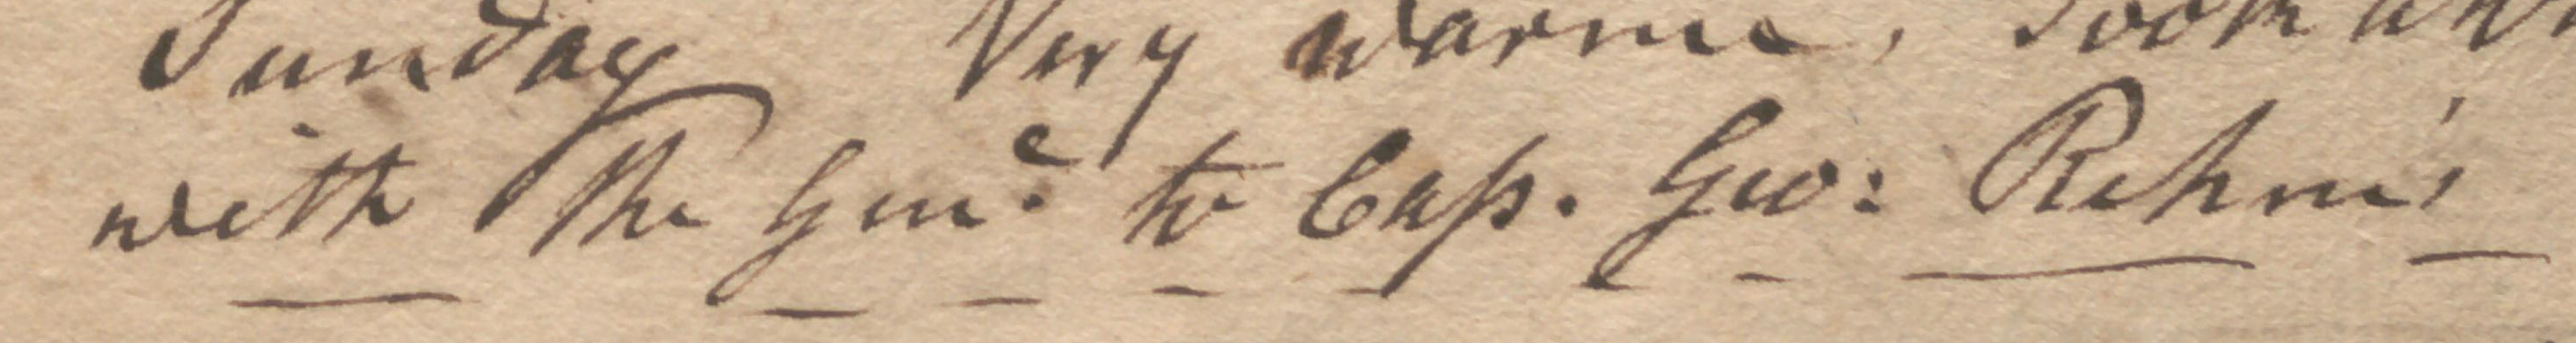with the Gen^l. to Cap. Geo:. Rehm's
